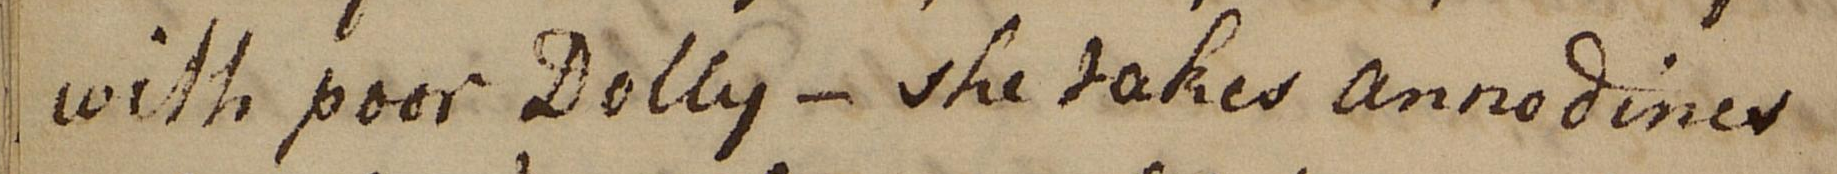with poor Dolly- she takes Annodines
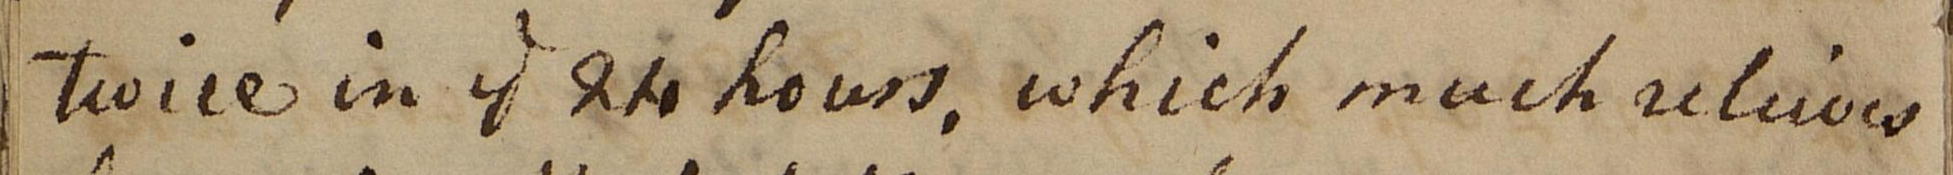twice in y^e 24 hours, which much releives
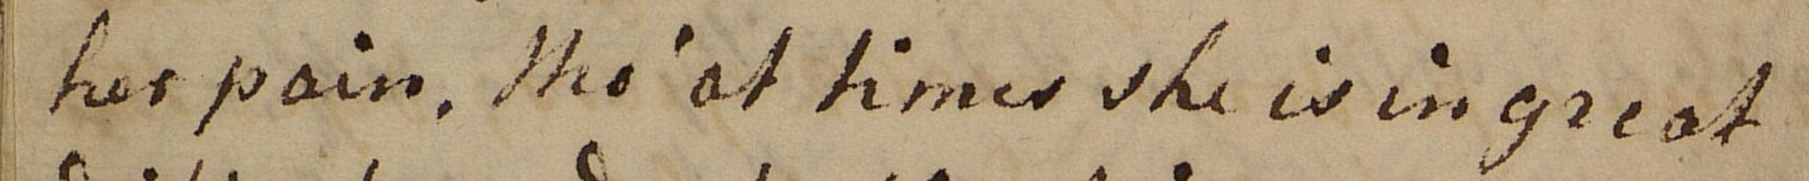her pain, tho' at times she is in great
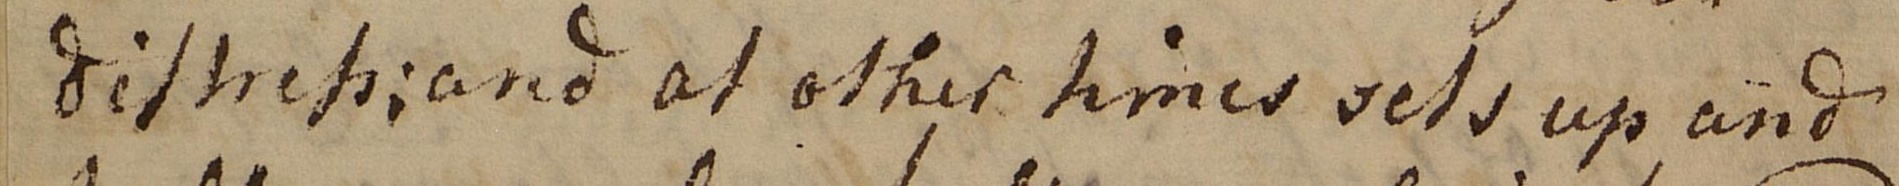distress; and at other times sets up and
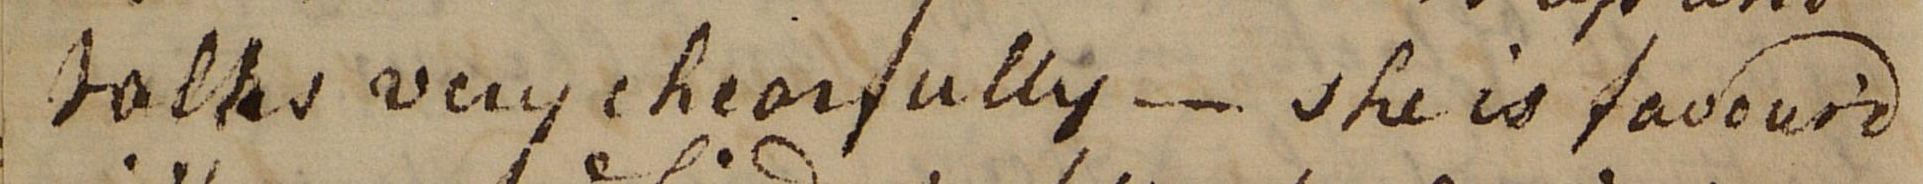talks very chearfully- she is favour'd
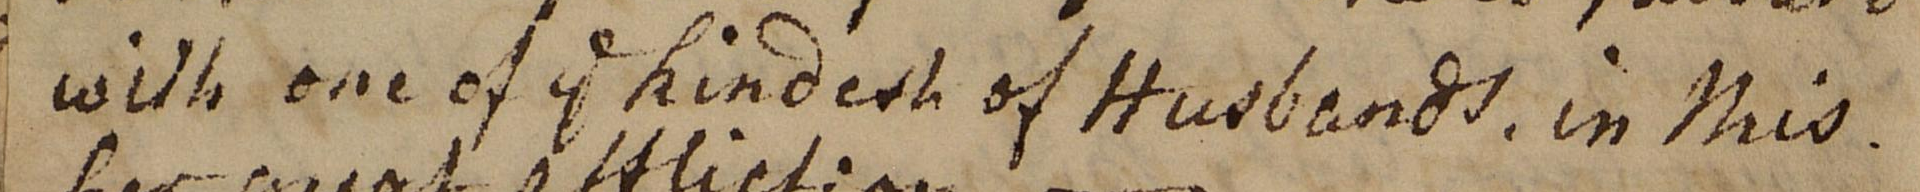with one of y^e kindest of Husbands, in this
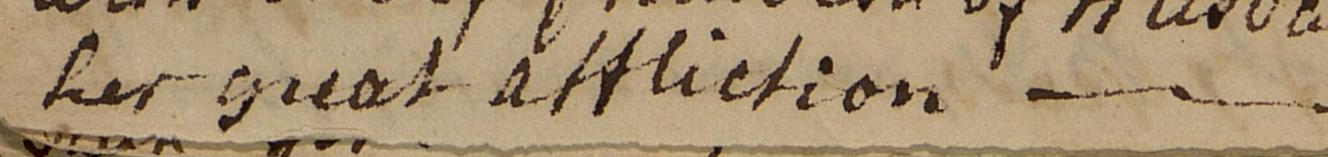her great affliction-
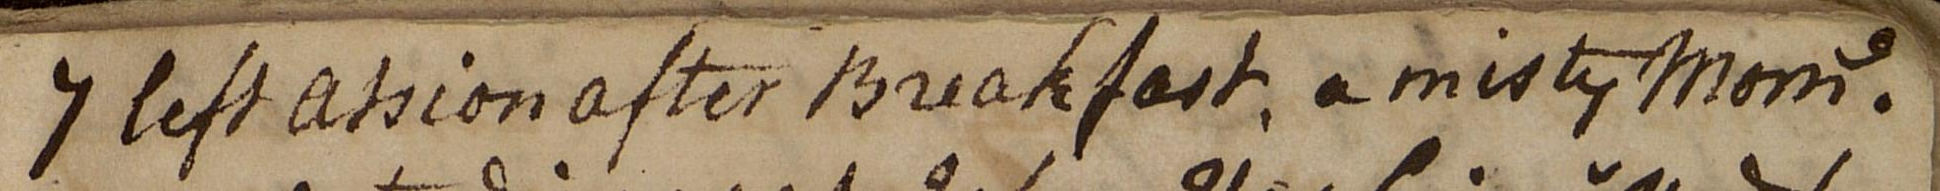7 left Atsion after Breakfast, a misty morn.^g
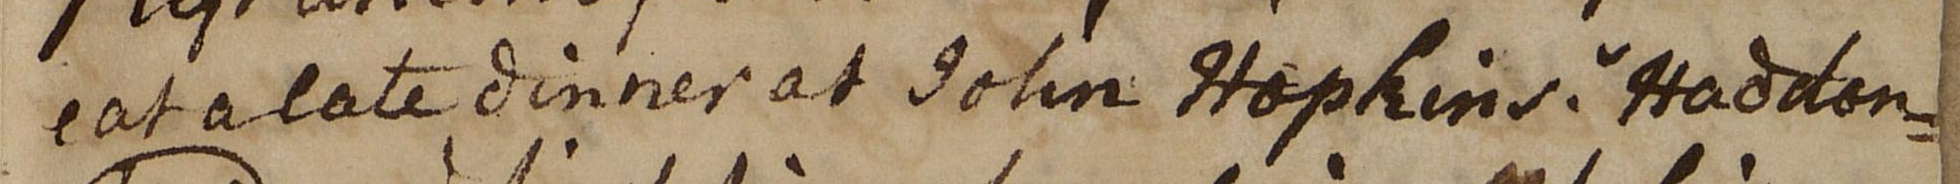eat a late dinner at John Hopkins^s Haddon-
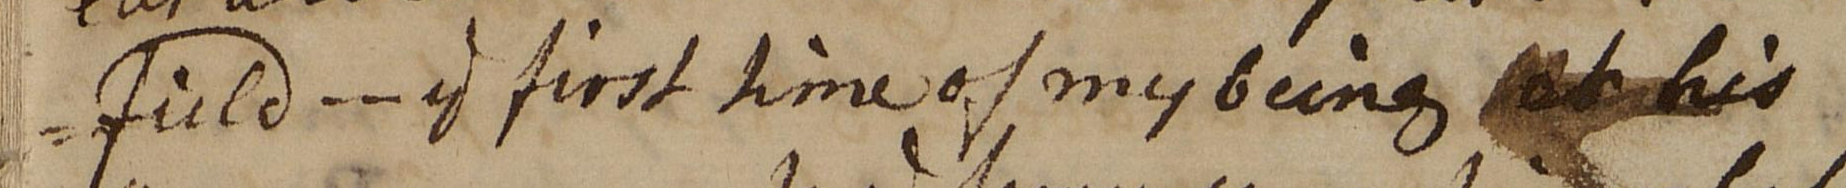-field- y^e first time of my being at his
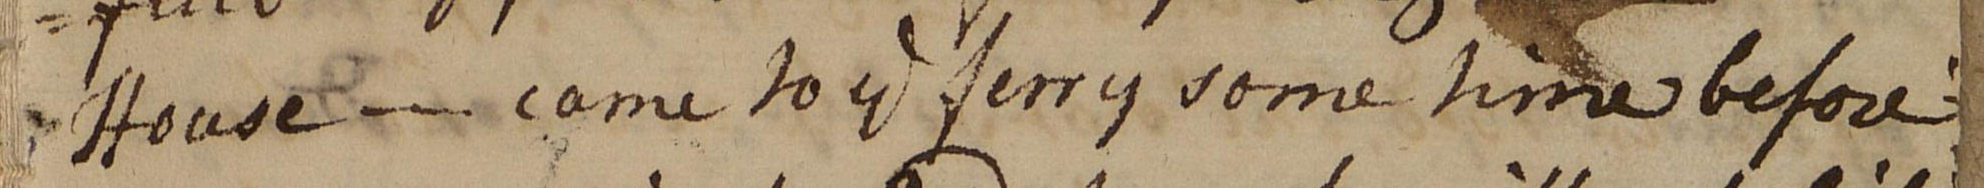House- came to y^e ferry some time before
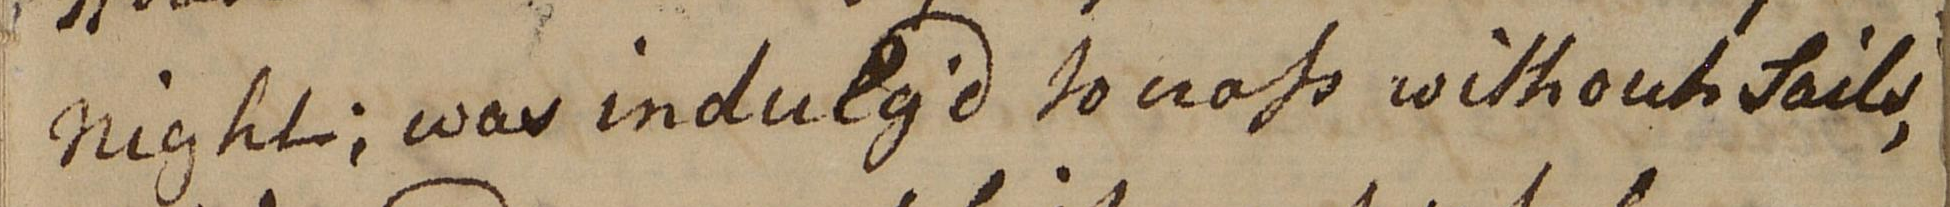Night; was indulg'd to cross without Sails,
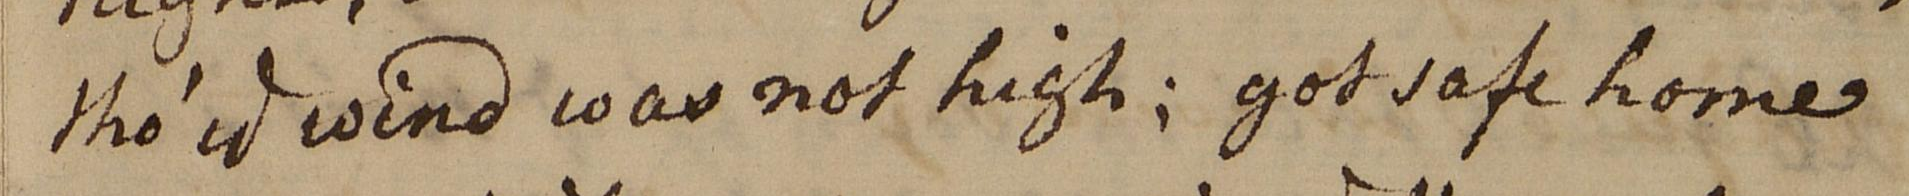tho' y^e wind was not high; got safe home
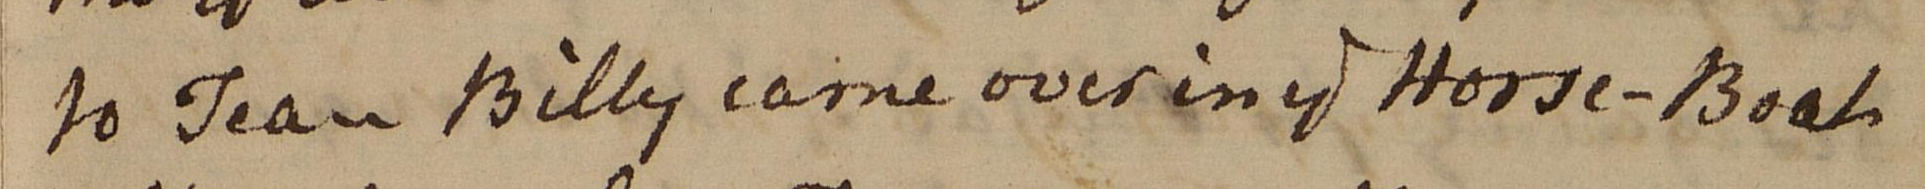to Jean Billy came over in y^e Horse-Boat
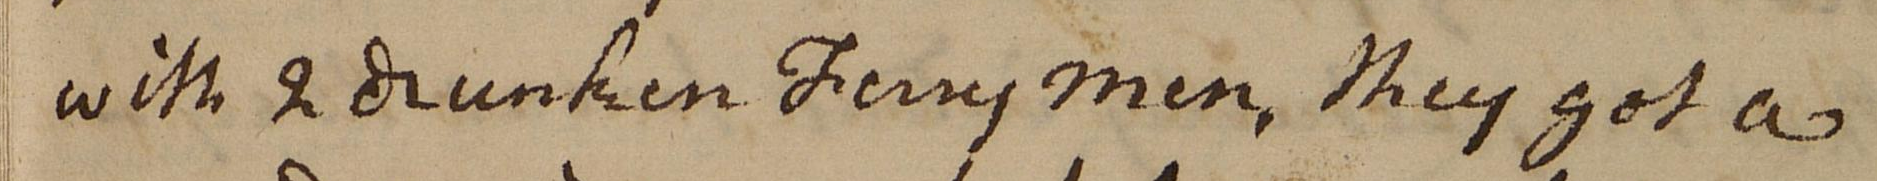with 2 drunken Ferry men, they got a
